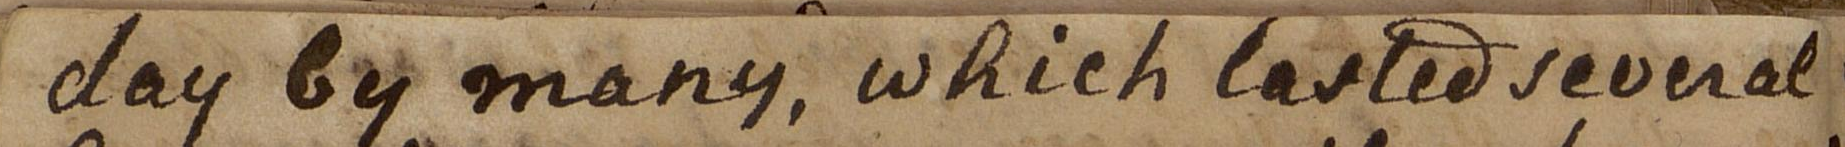day by many, which lasted several
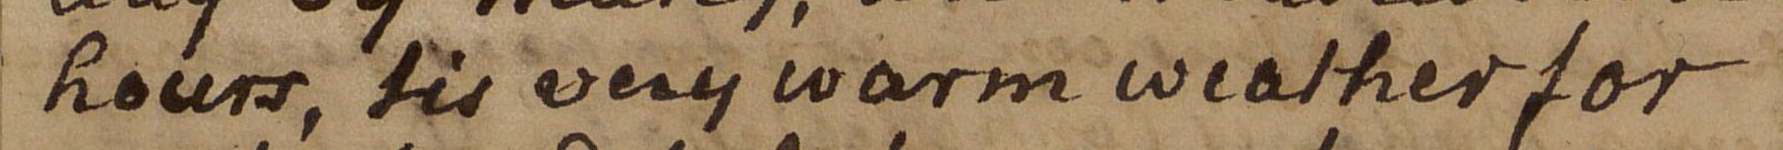hours, tis very warm weather for
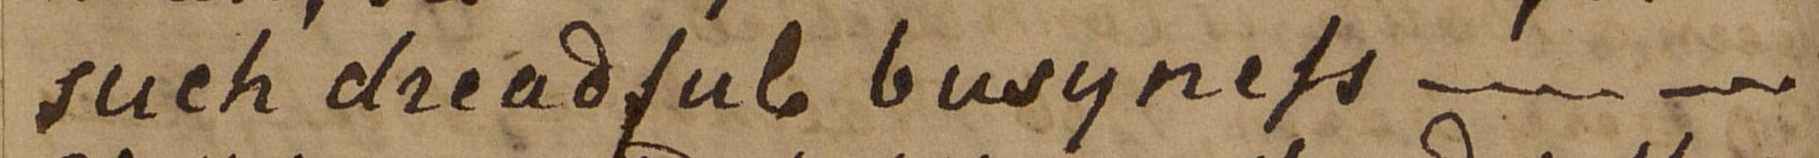such dreadful busyness--
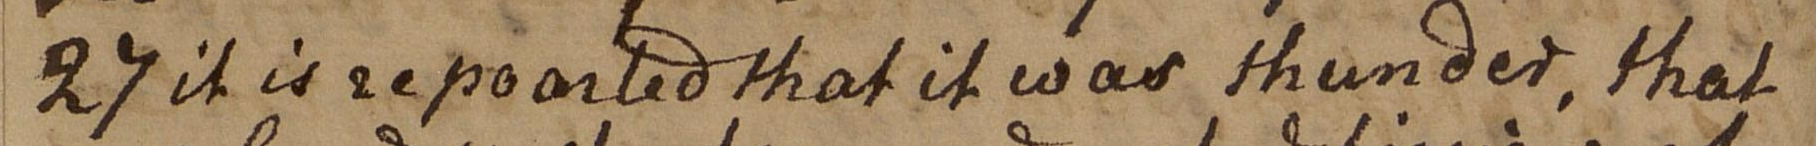27 it is repoarted that it was thunder, that
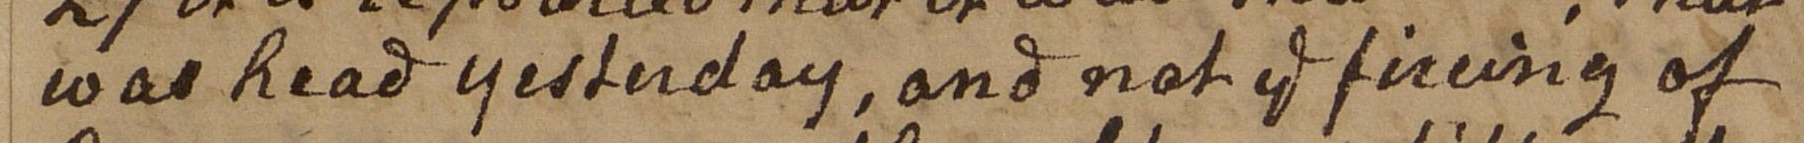was head yesterday, and not y^e firing of
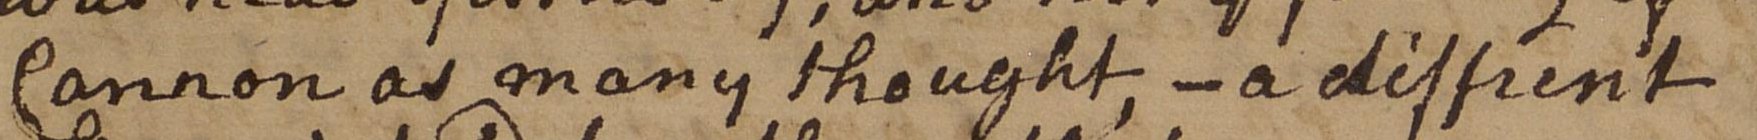Cannon as many thought,- a diffrent
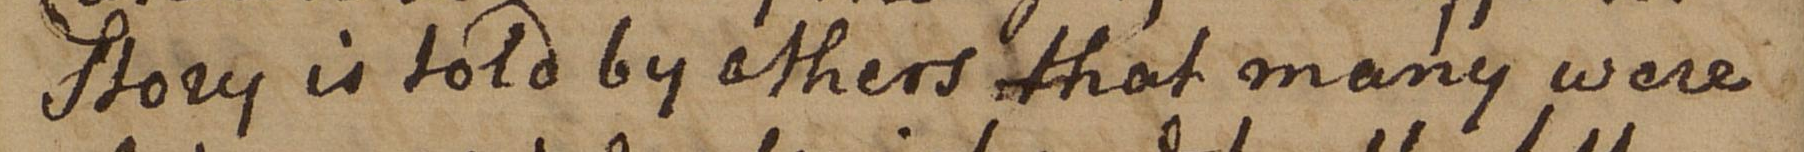Story is told by others that many were
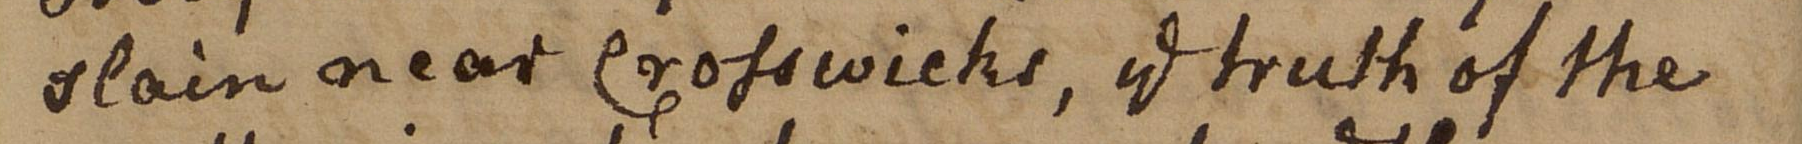slain near Crosswicks, y^e truth of the
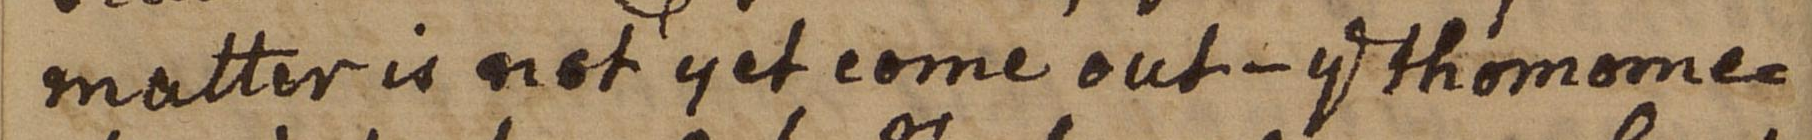matter is not yet come out- y^e thomome-
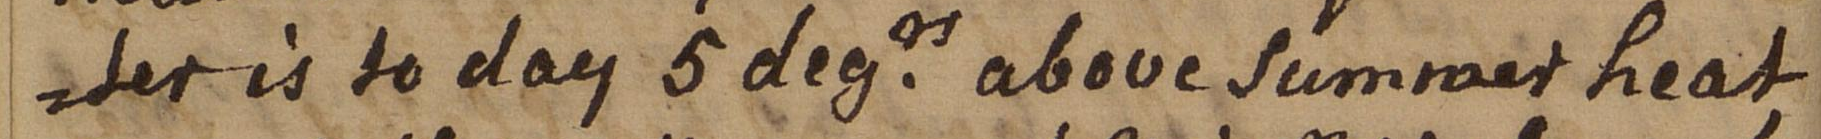-ter is to day 5 deg^rs. above Summer heat,
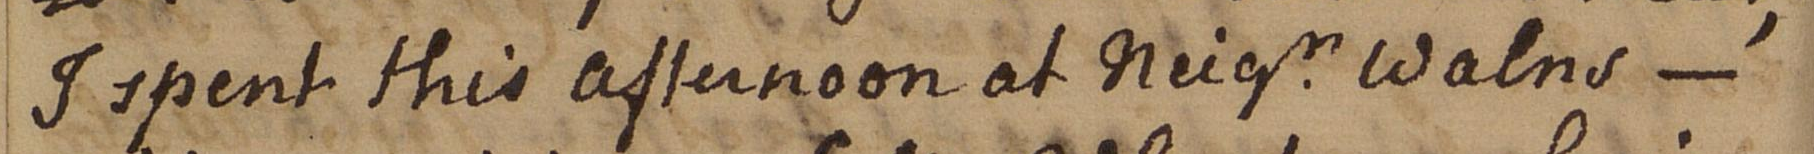I spent this afternoon at Neig^r. Walns-
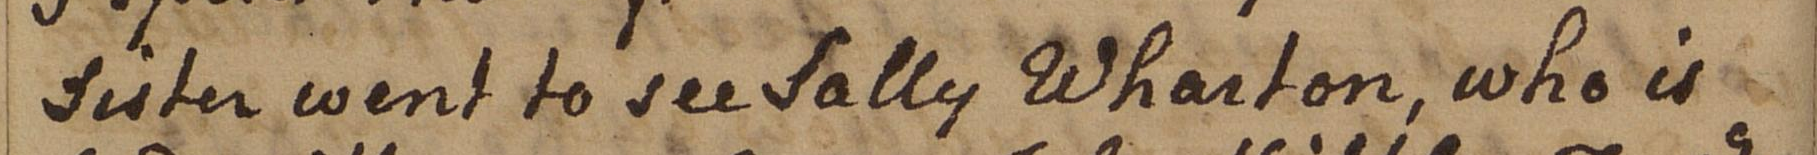Sister went to see Sally Wharton, who is
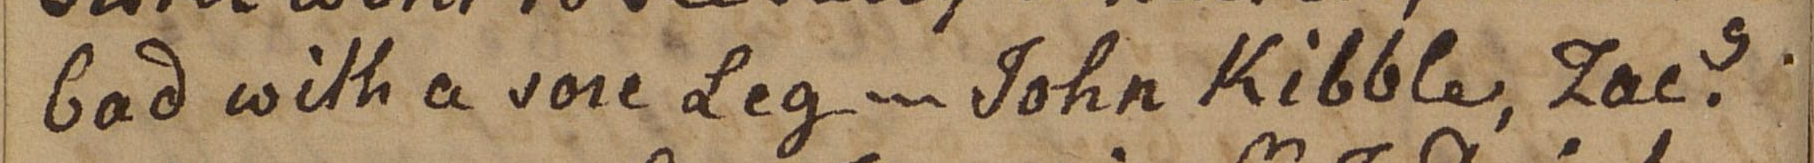bad with a sore Leg- John Kibble, Zac^g.
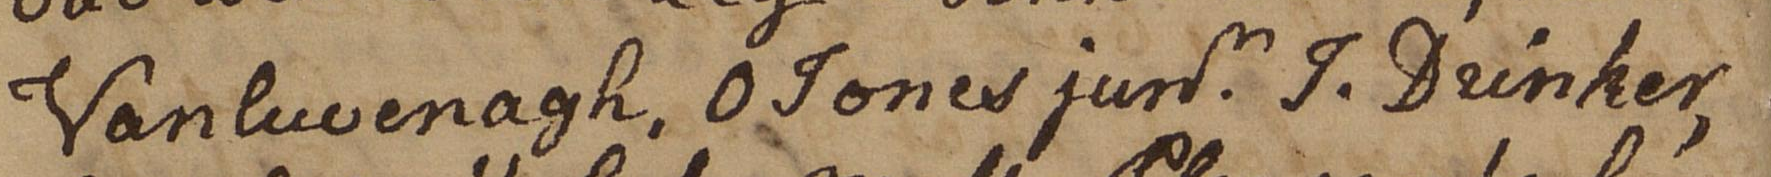Vanluvenagh, O Jones jun^r. T. Drinker,
